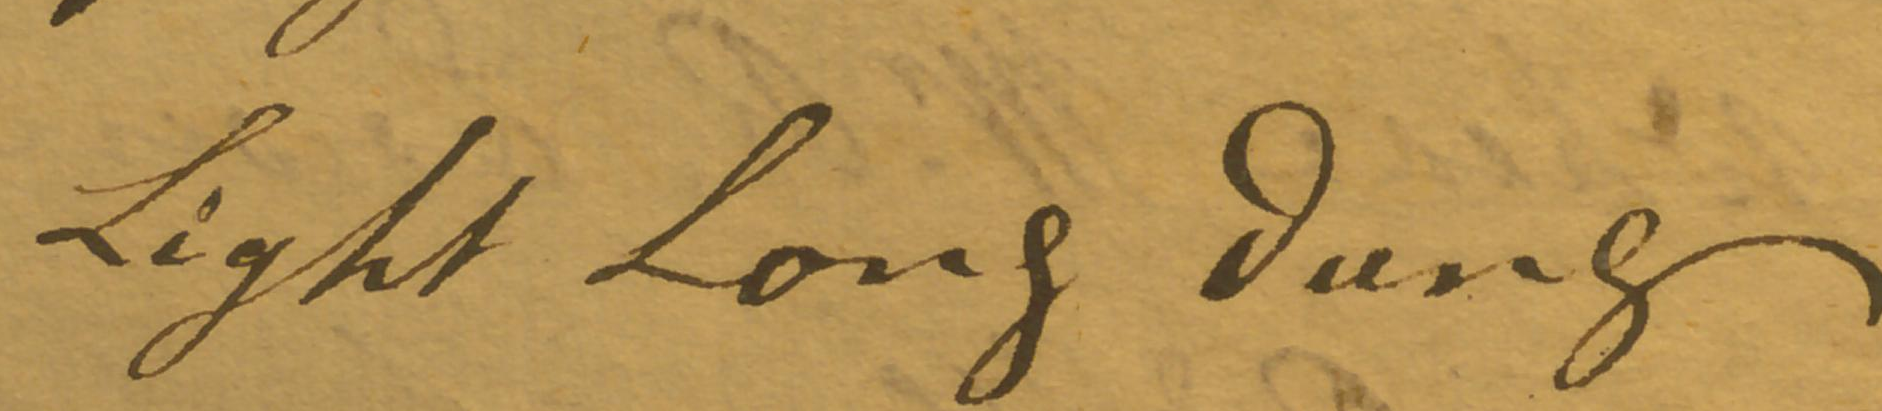Light Long dung
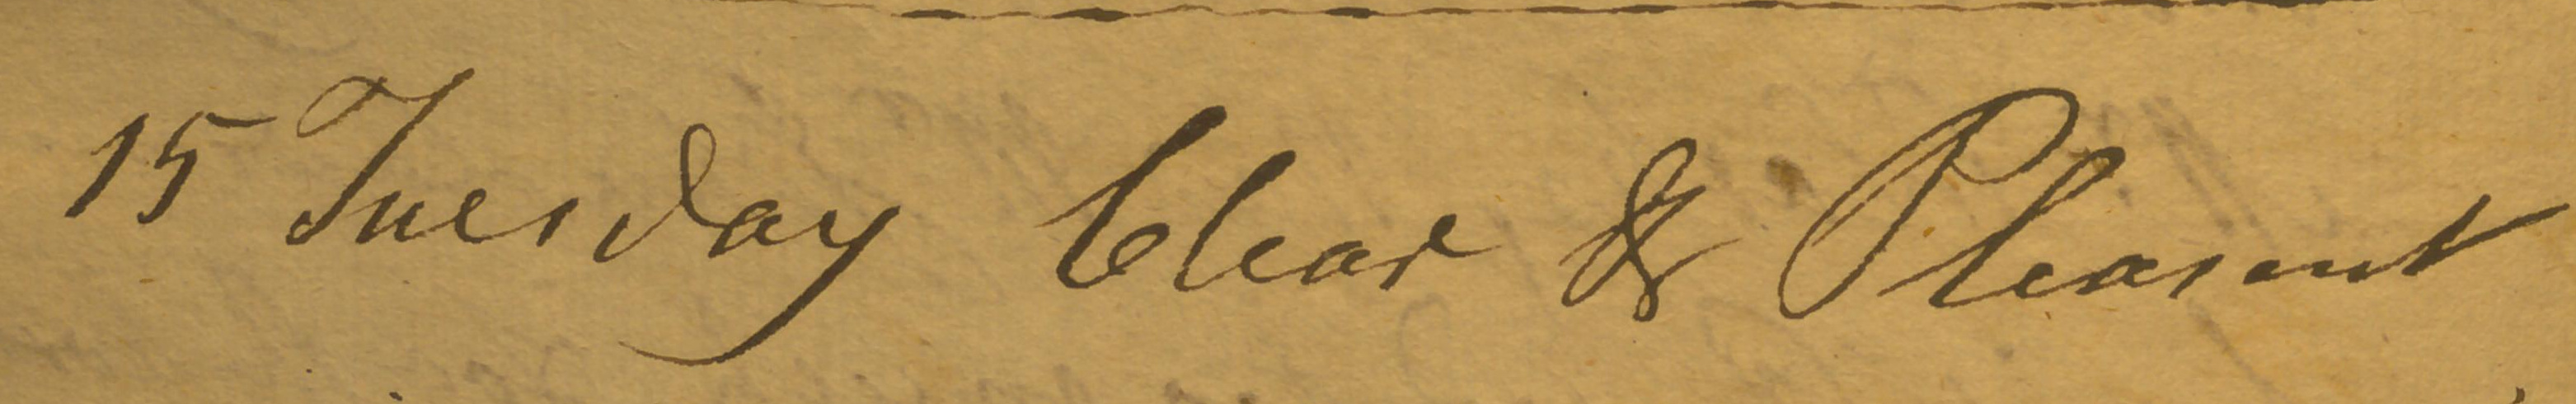15 Tuesday Clear & Pleasent
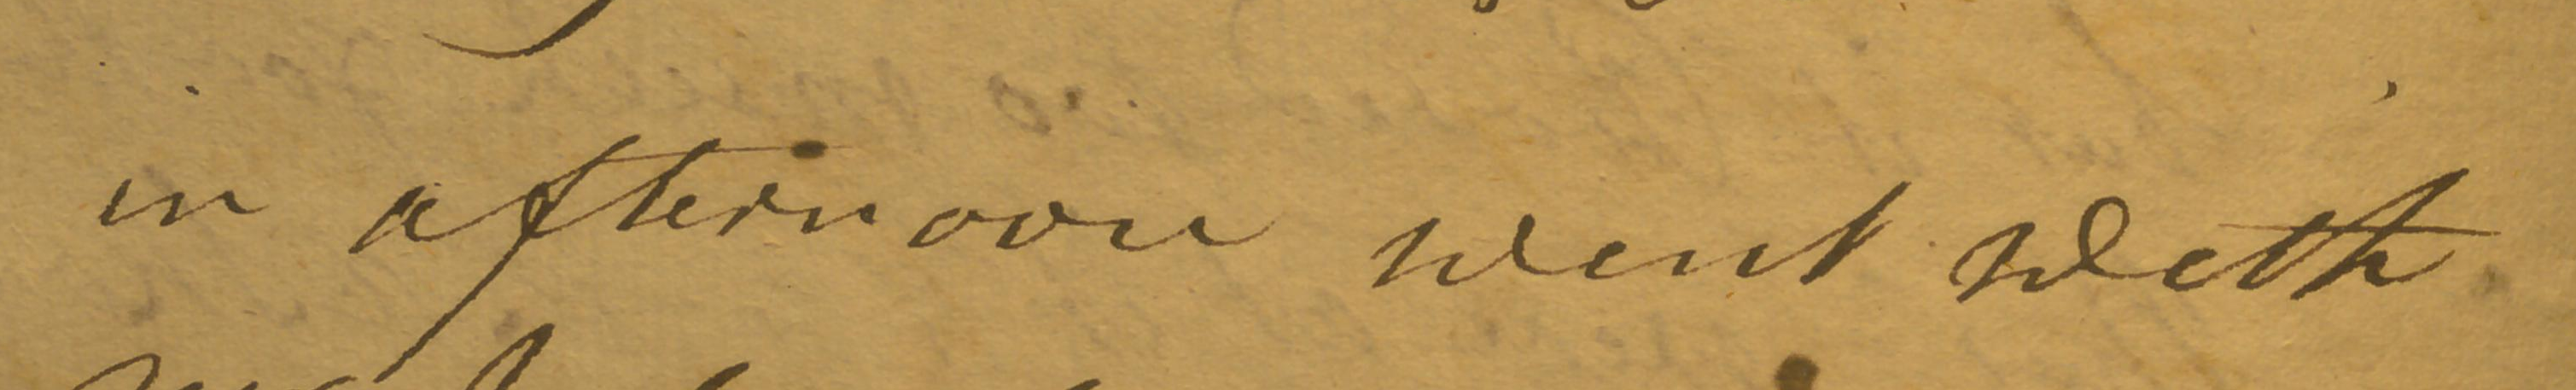in afternoon went with
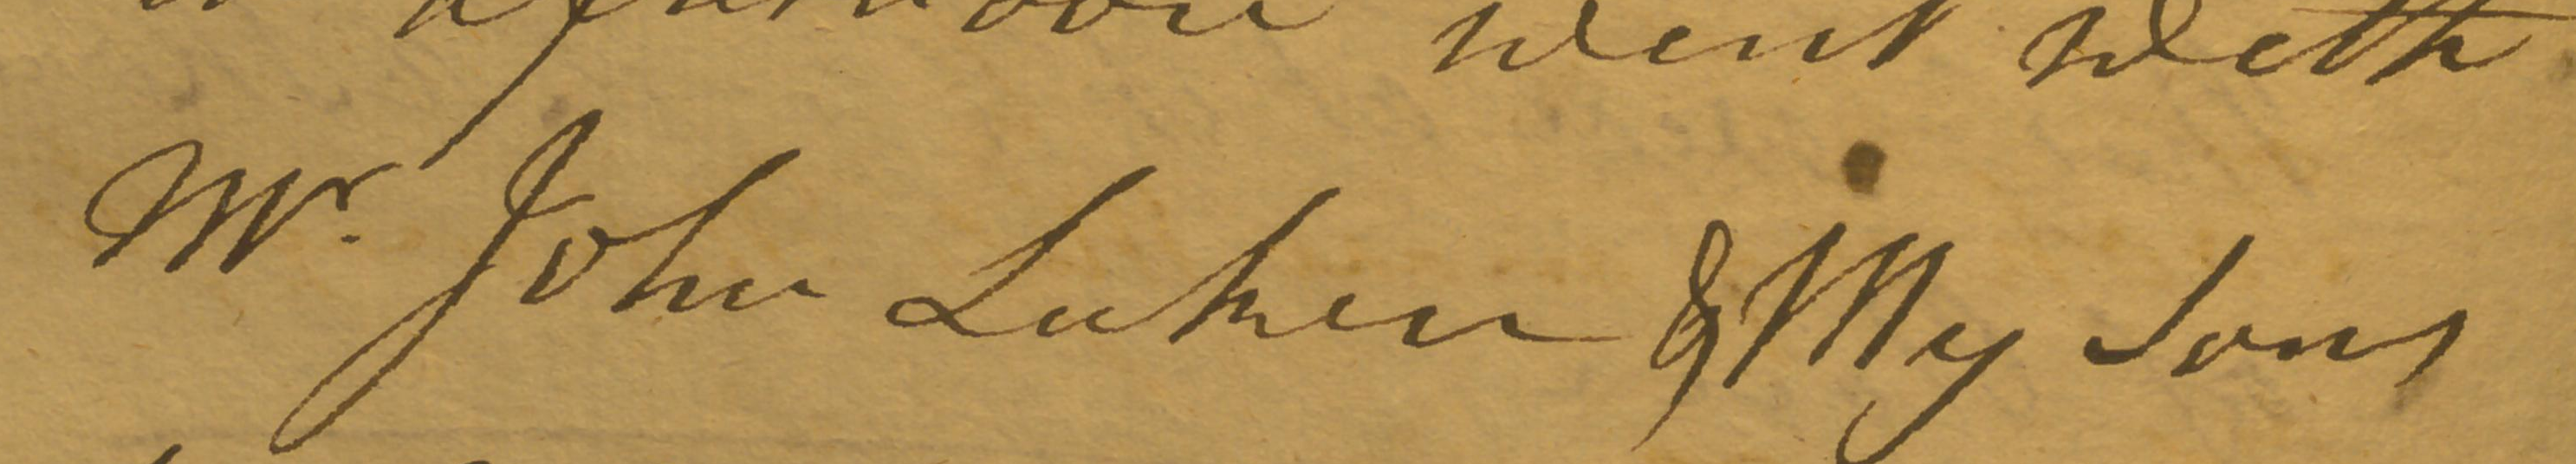M^r. John Luken & My Sons
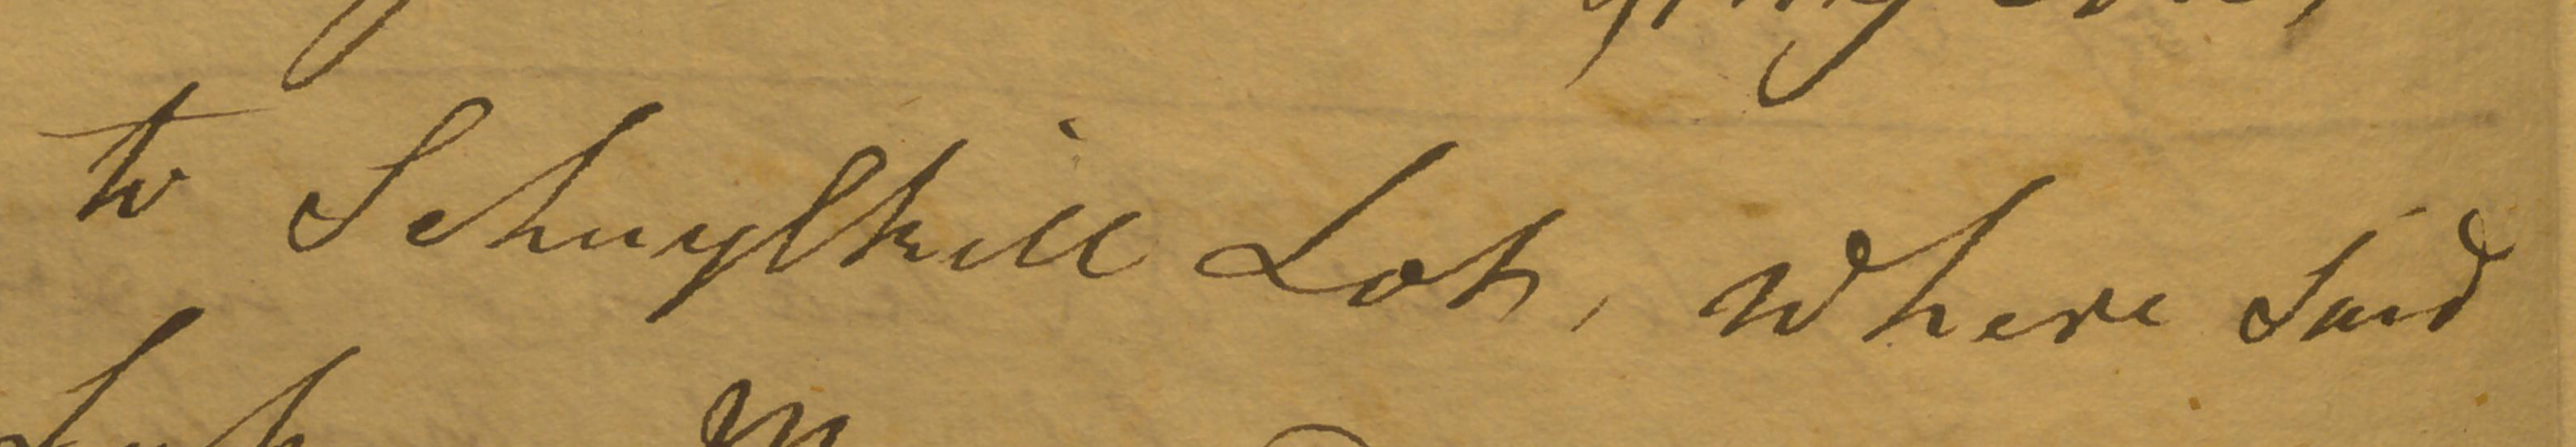to Schuylkill Lot, where said
